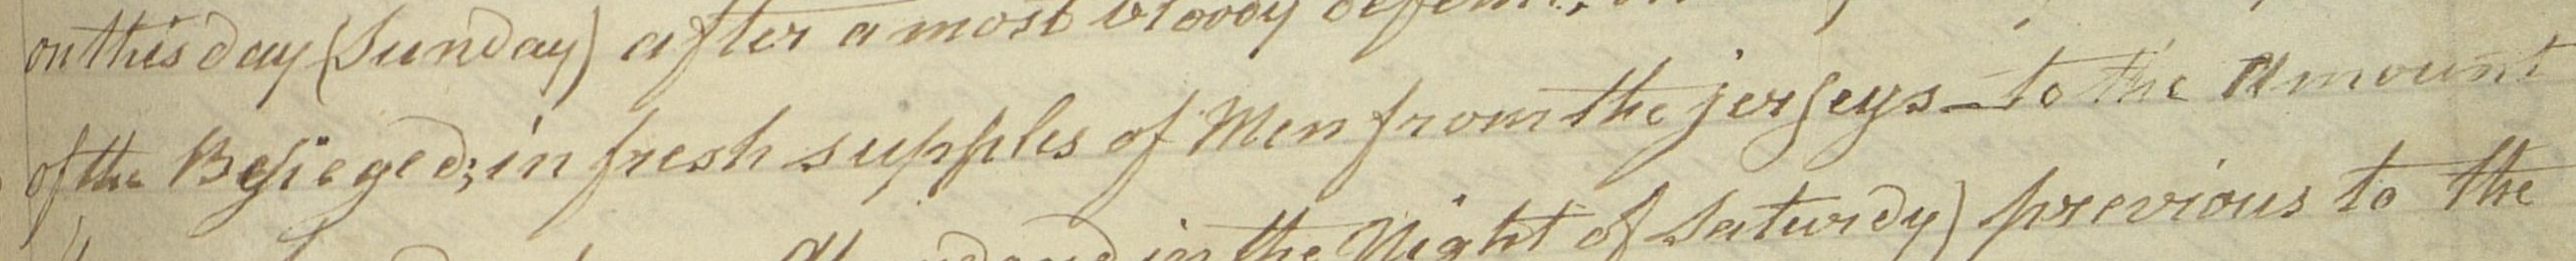of the Besieged; in fresh supples of Men from the jerseys, to the Amount
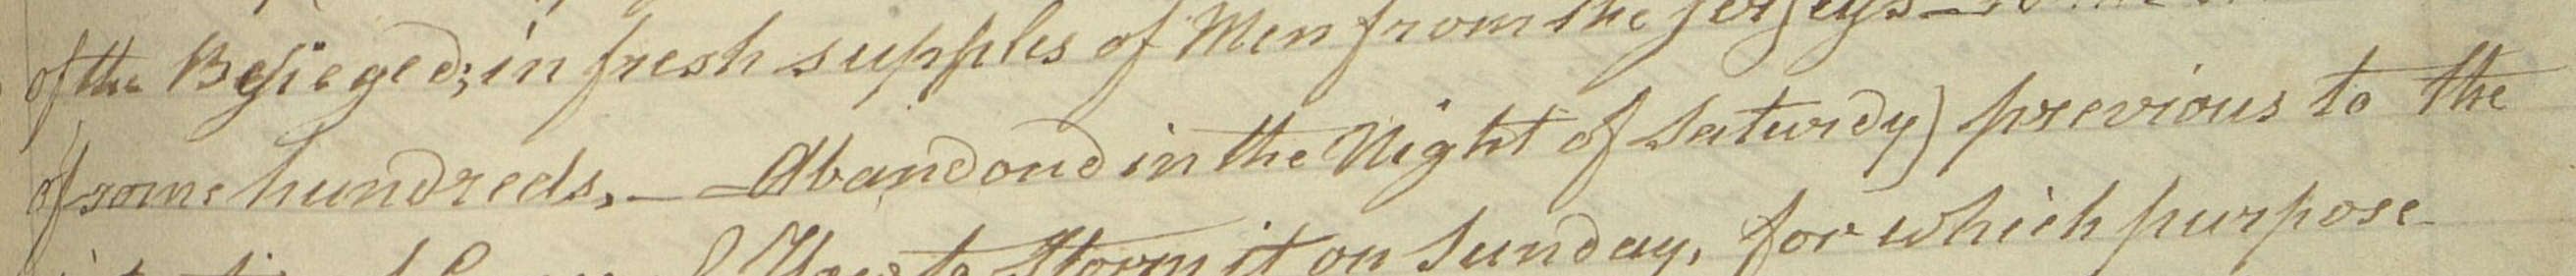of some hundreds. Abandond in the Night of Saturdy) previous to the
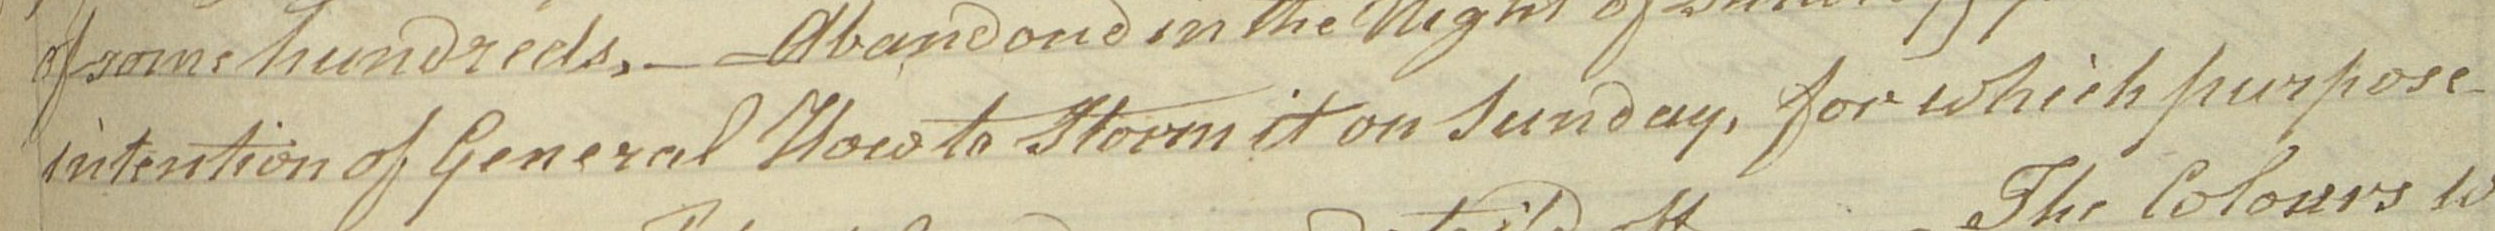intention of General How to Storm it on Sunday, for which purpose
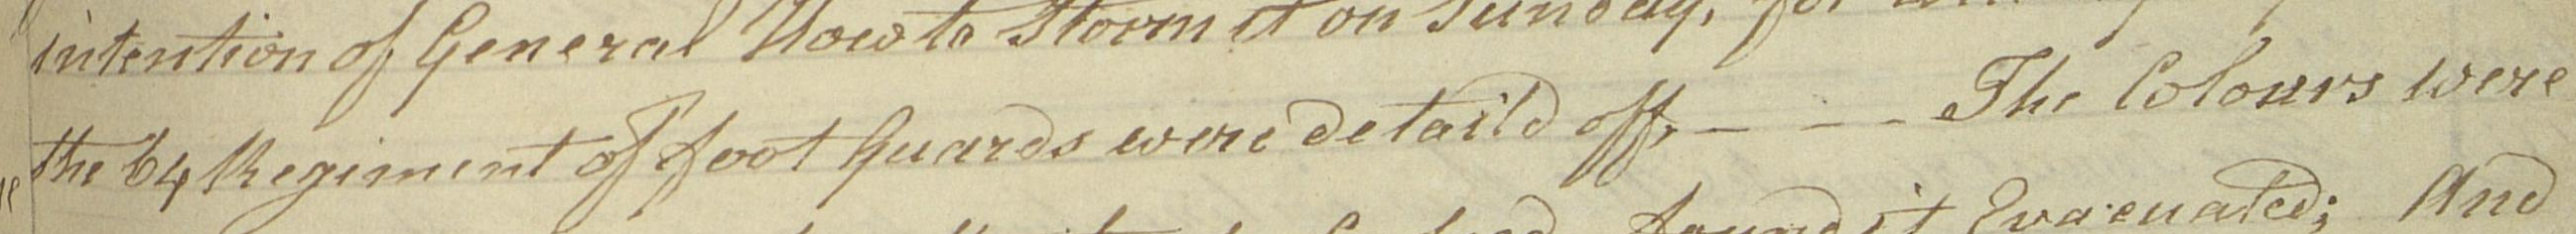the 64 Regiment of foot Guards were detail'd off Thie Colours were
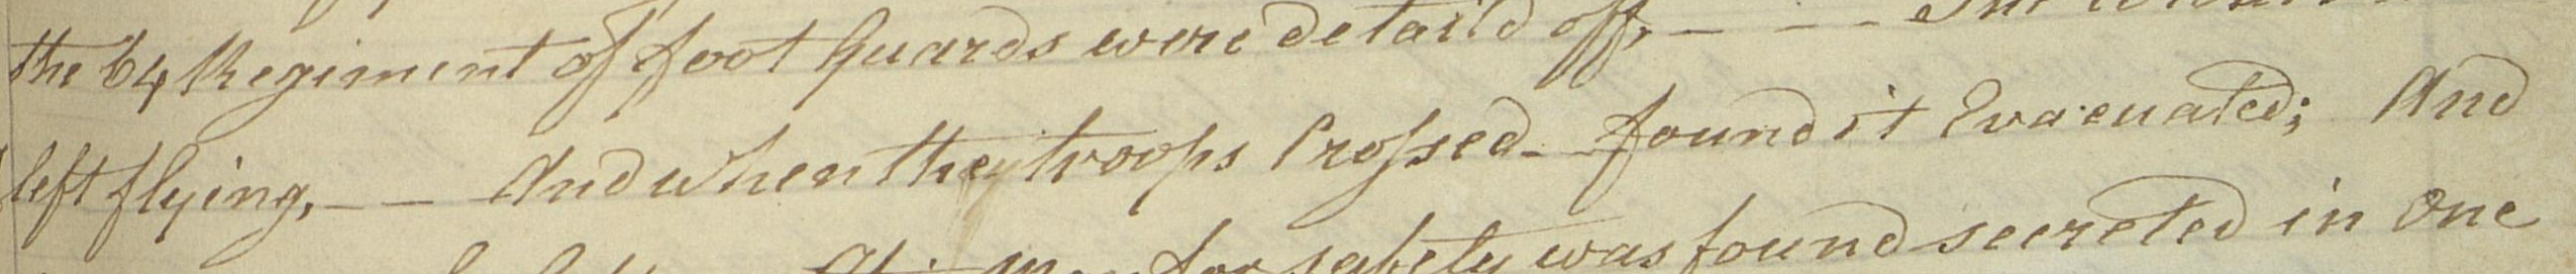left flying, And when the troops Crossed, found it Evacuated; And
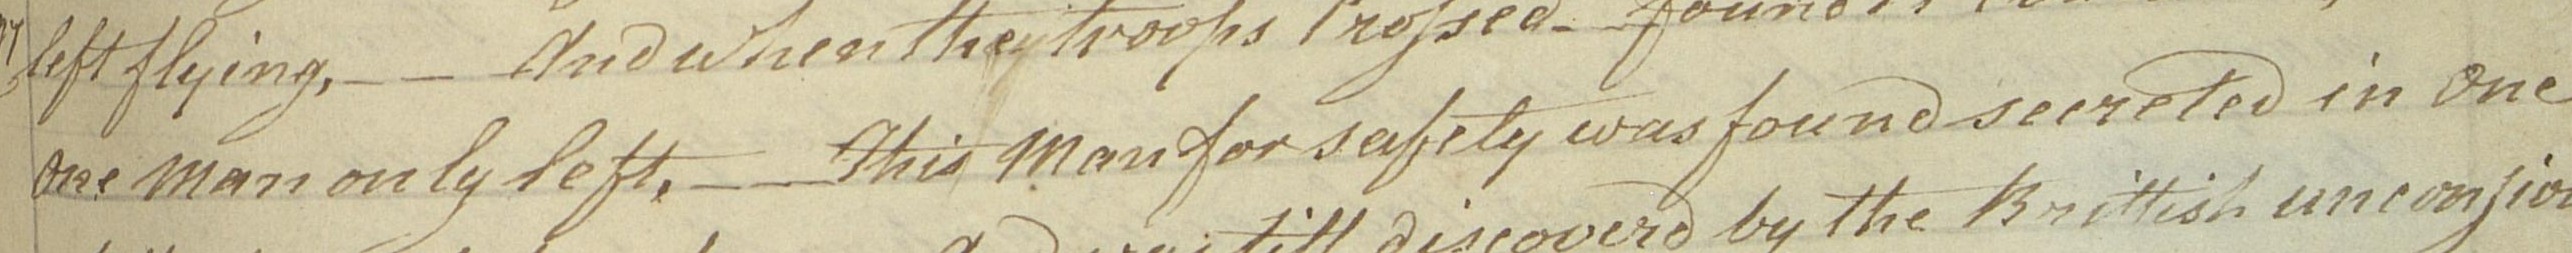one man only left, This Man for safety was found secreted in One
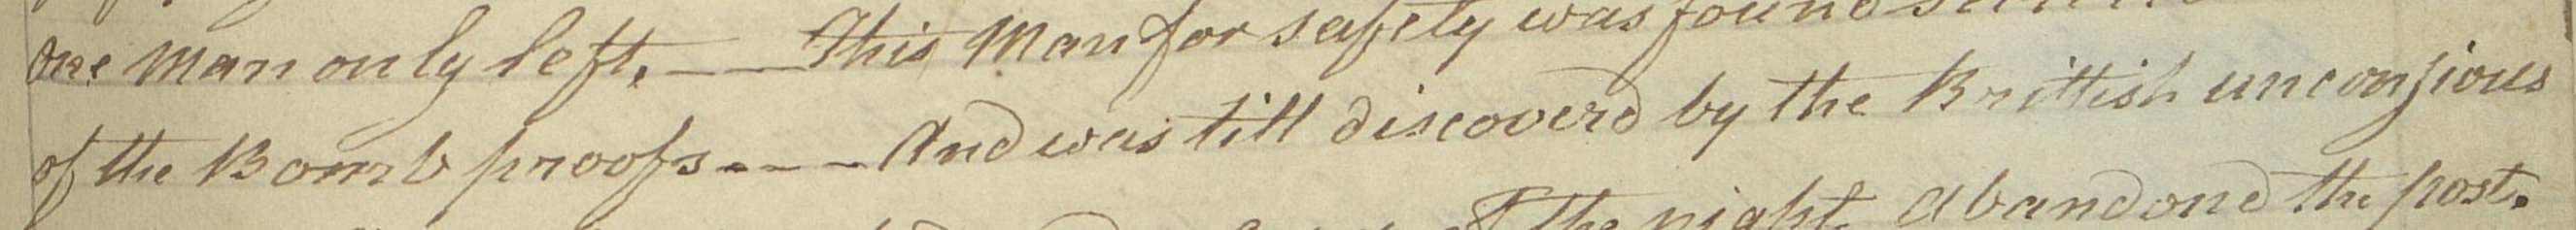of the Bomb proofs. And was till discoverd by the Brittish unconsious
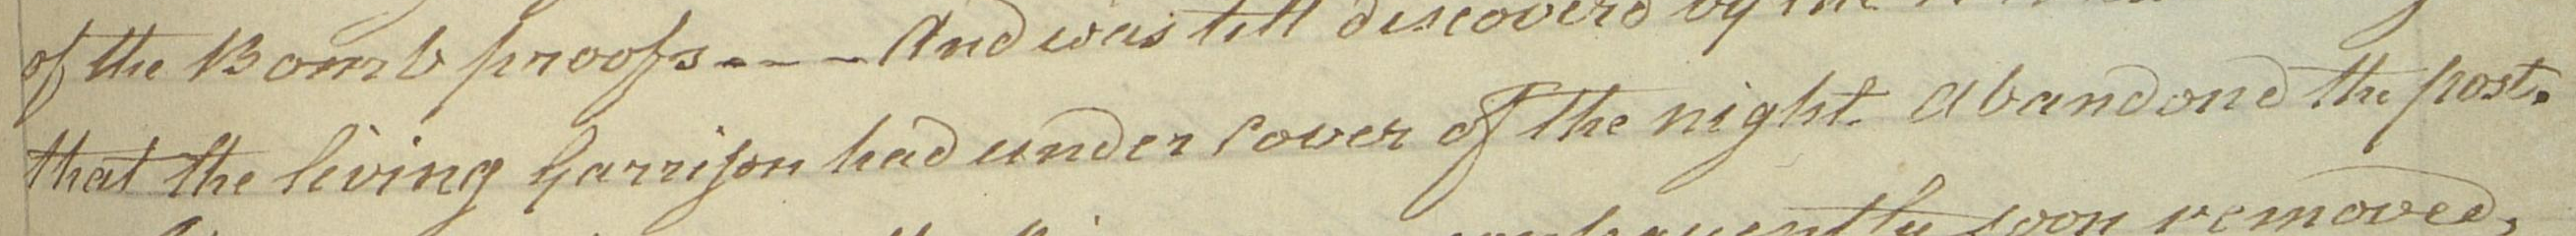that the living Garrison had under cover of the night Abandoned the post.
